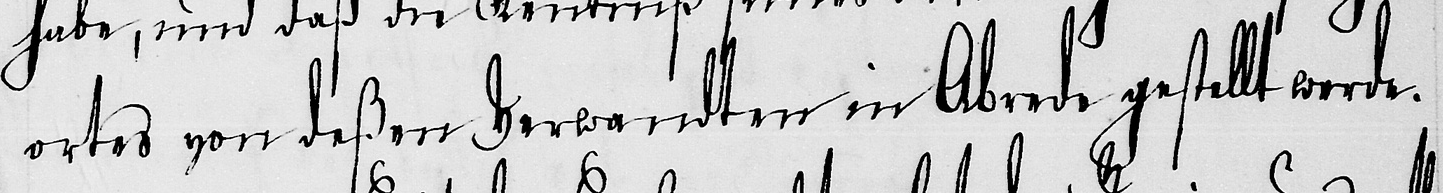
ortes von deßen Verwandten in Abrede gestellt werd¬
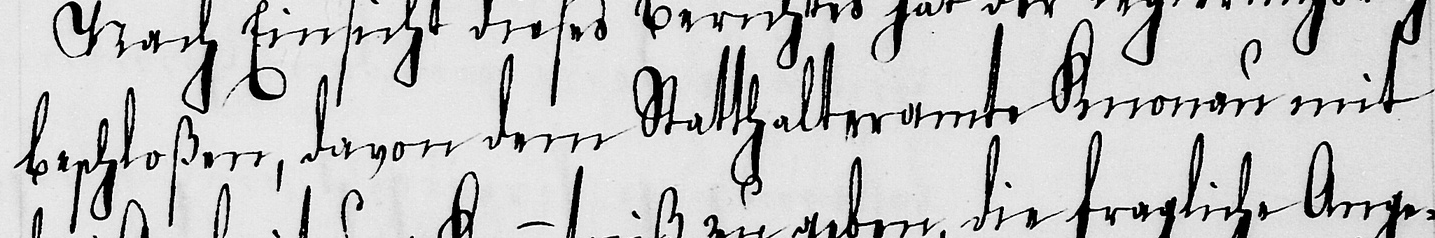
beschloßen, davon dem Statthalteramte Knonau mit
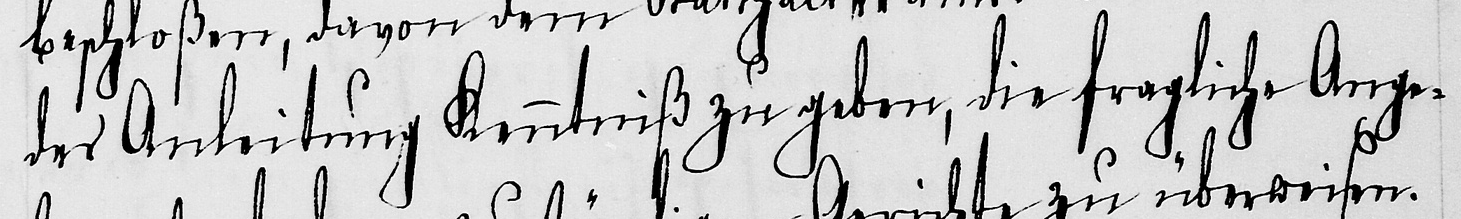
der Anleitung Kenntniß zu geben, die fragliche Ange¬
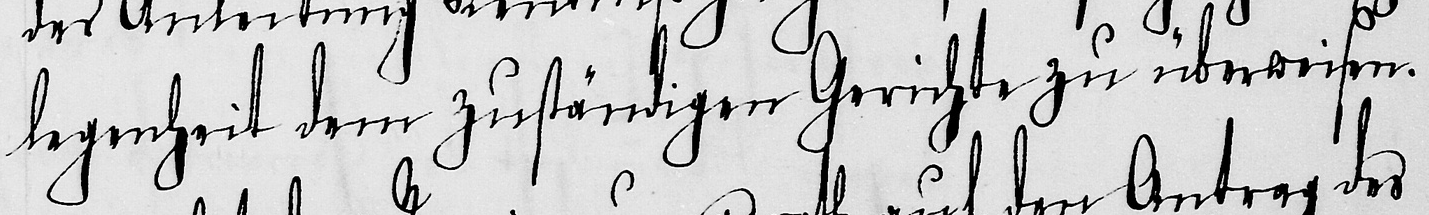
legenheit dem zuständigen Gerichte zu überweisen.
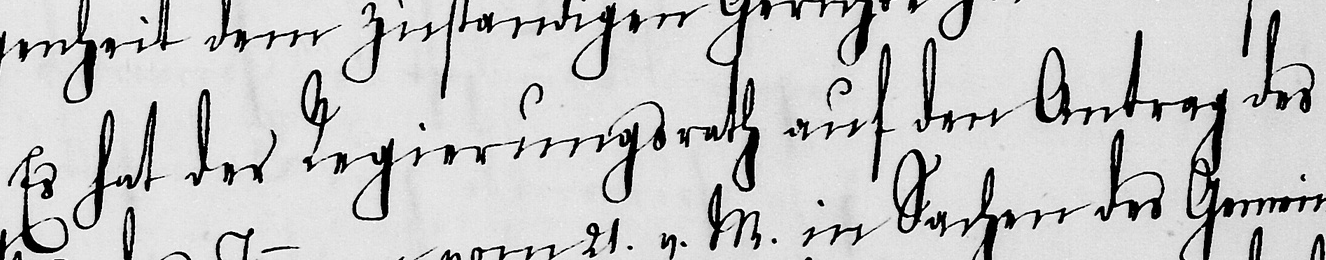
Es hat der Regierungsrath auf den Antrag des
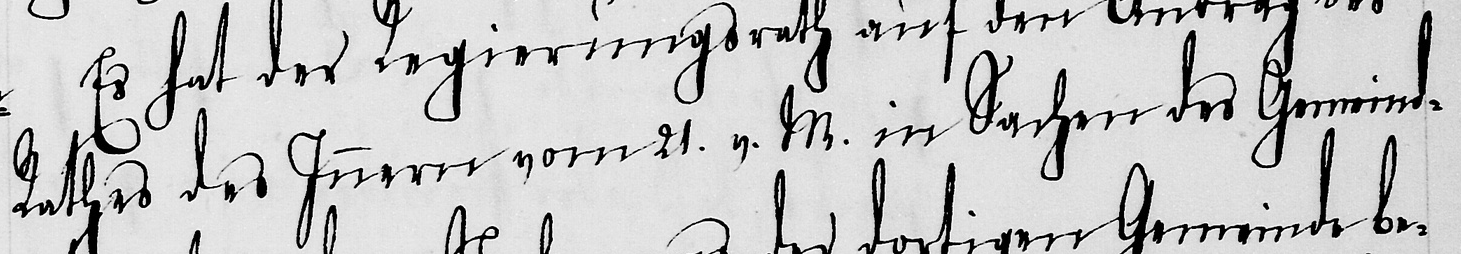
Rathes des Innern vom 21. v. M. in Sachen des Gemeindr¬
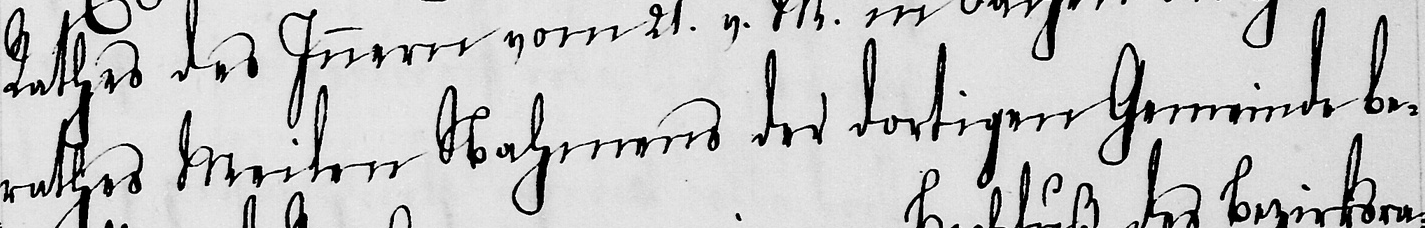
athes Meilen Nahmens der dortigen Gemeinde be¬
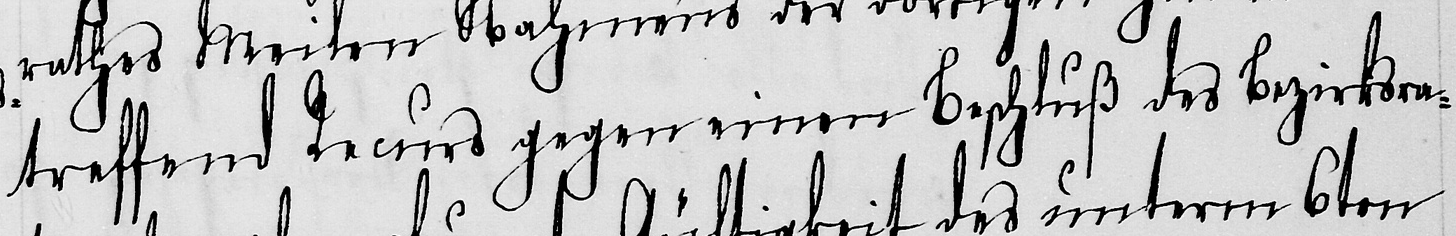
treffend Recurs gegen einen Beschluß des Bezirksra¬
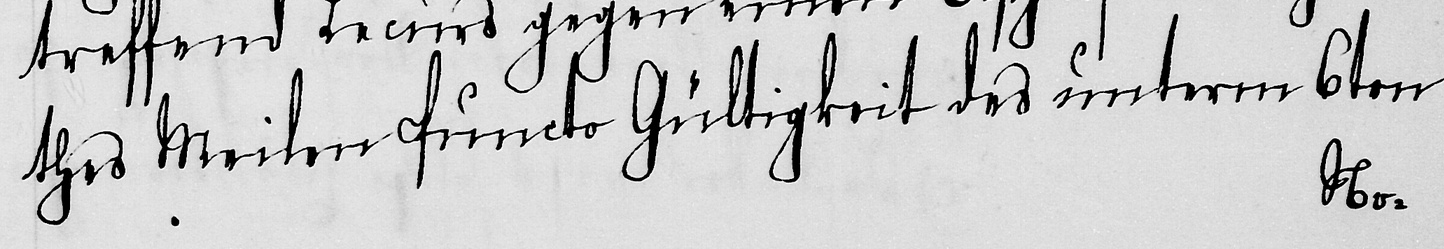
thes Meilen Puncto Gültigkeit des unterm 6ten
